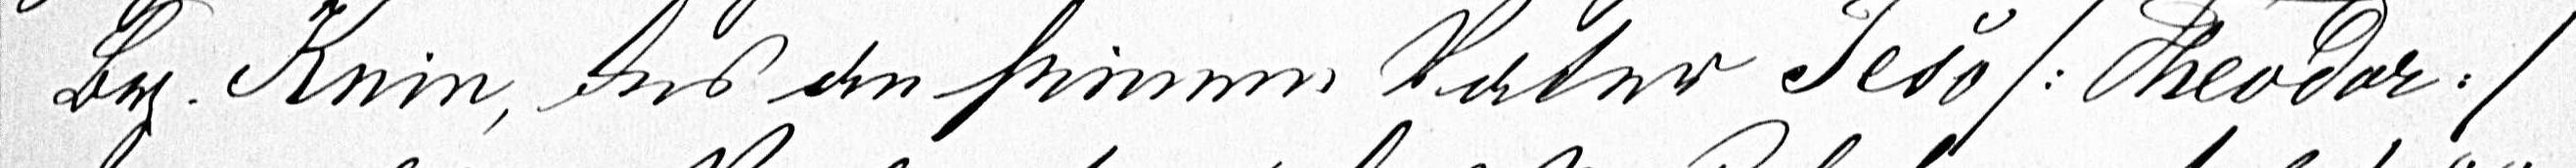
Bez. Kein, des an seinem Vater Tešo (Theodor)
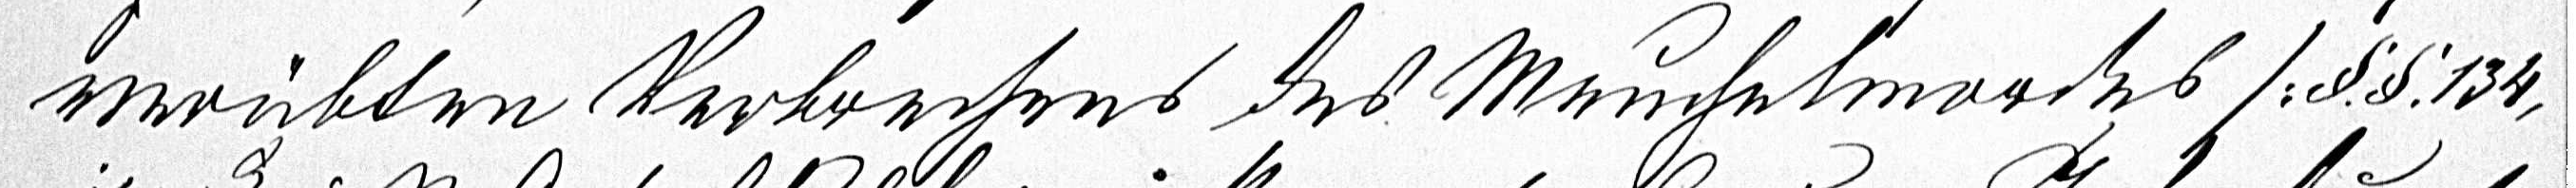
[that’s in the original] verübten Verbrechens des Meuchelmordes (§§134,
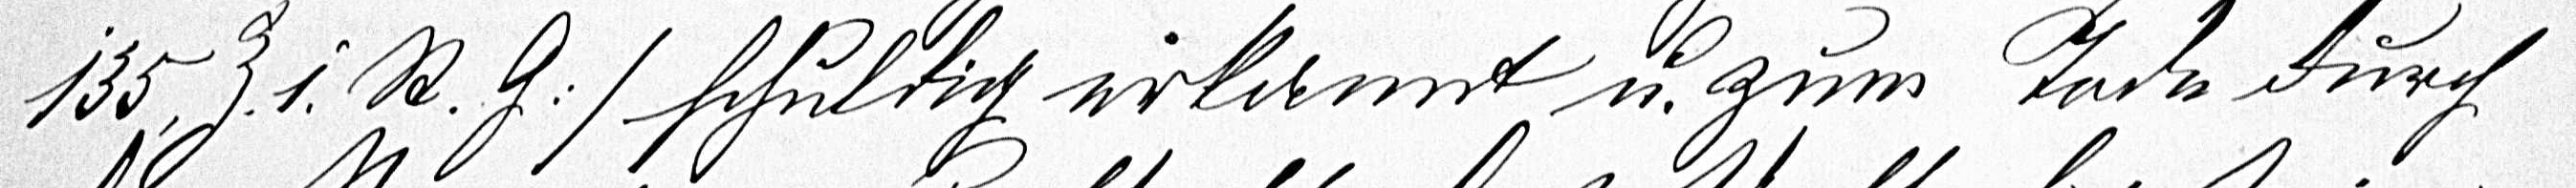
135 Z 1 St G) schuldig erkannt u. zum Tode durch
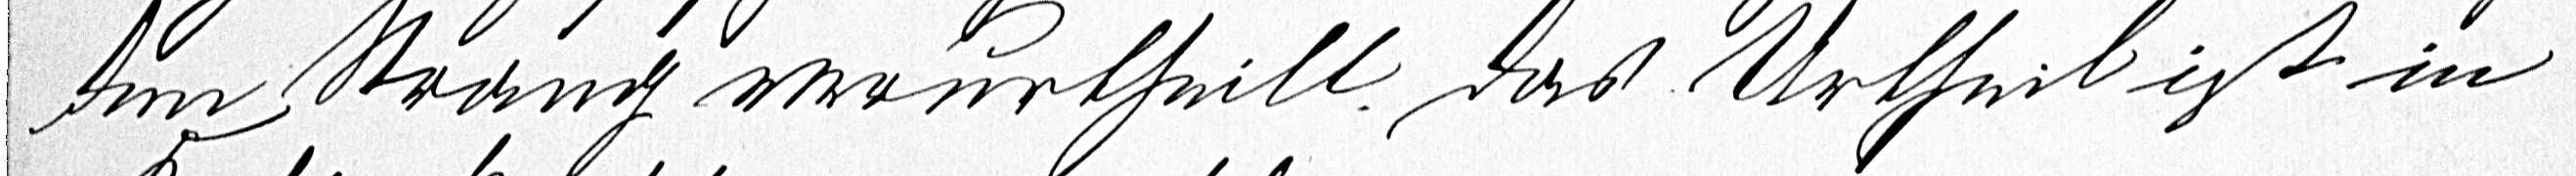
den Strang verurtheilt. Das Urtheil ist in
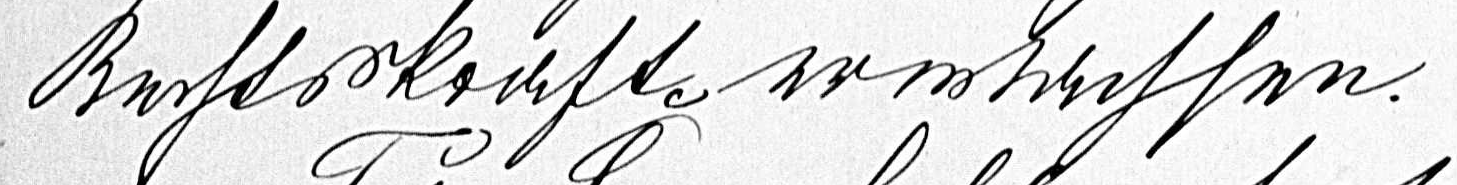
Rechtskraft erwachsen.
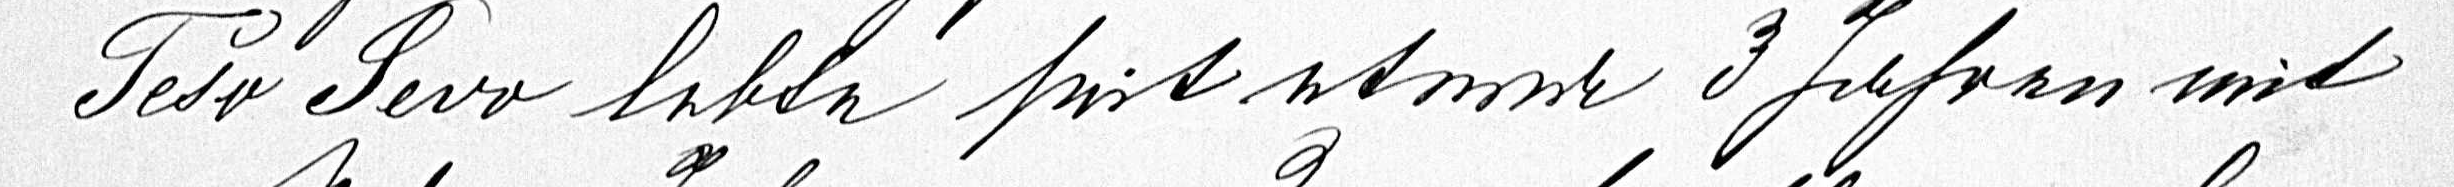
Tešo Ševo lebte seit etwa 3 Jahren mit
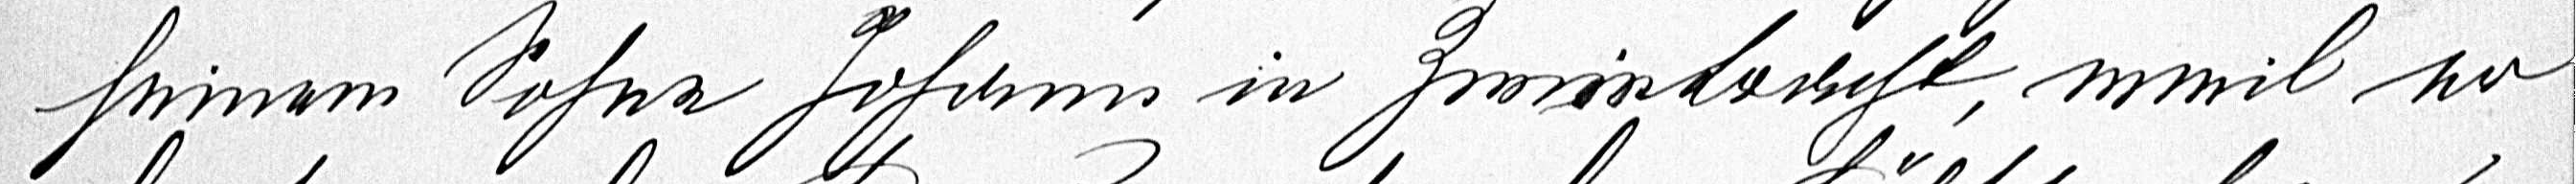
seinem Sohne Johann in Zwietracht, weil er
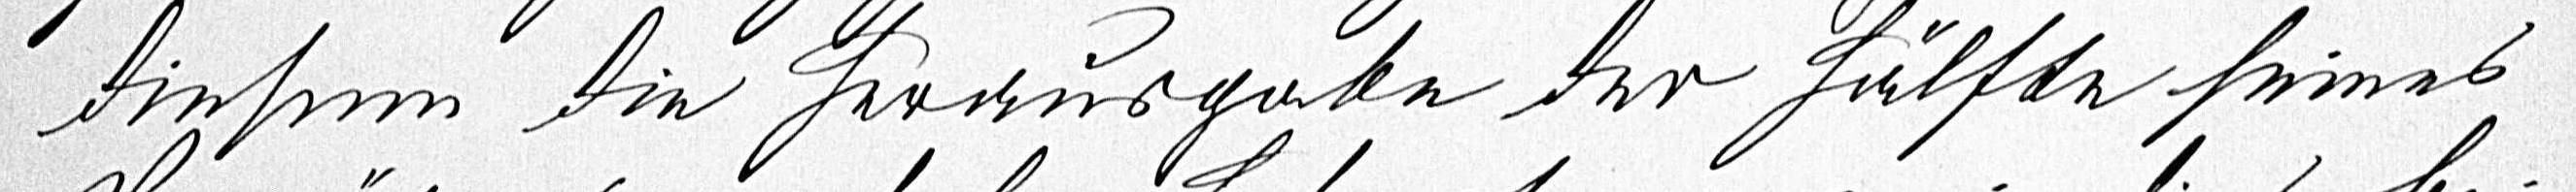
diesem die Herausgabe der Hälfte seines
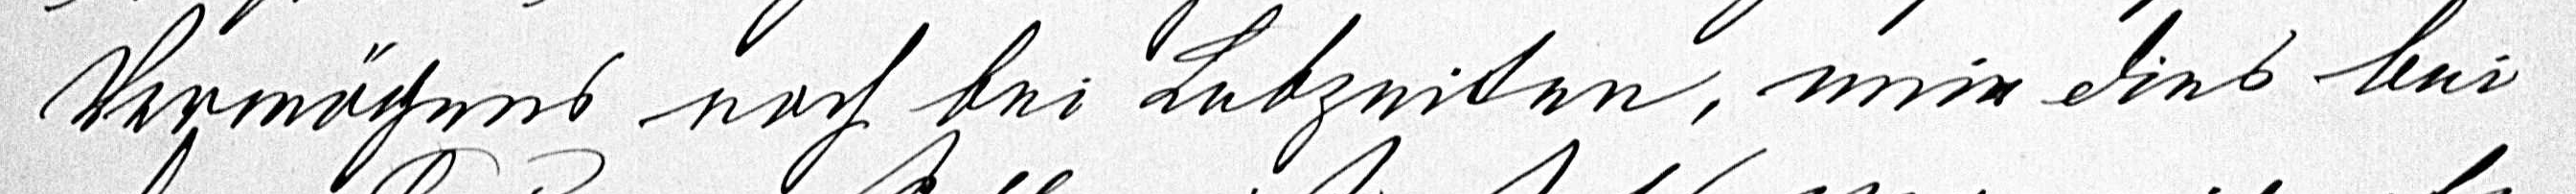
Vermögens noch bei Lebzeiten, wie dies bei
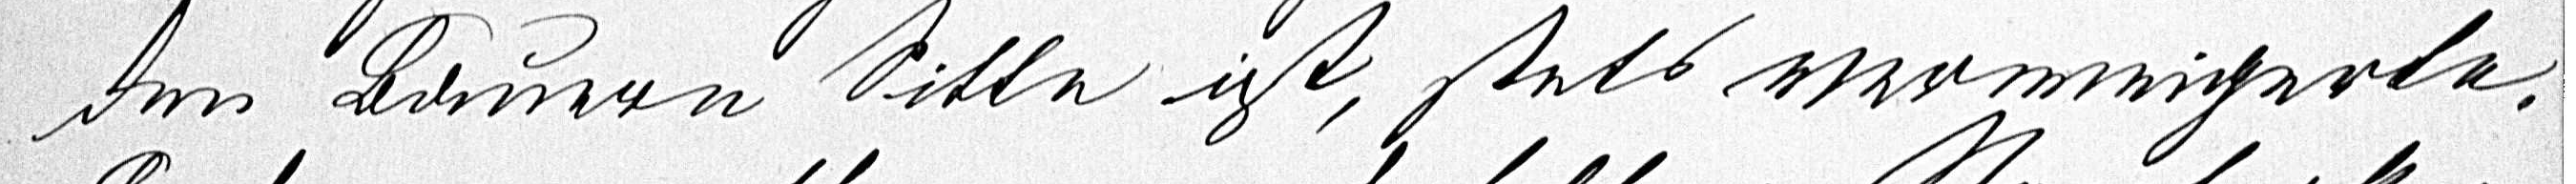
den Bauern Sitte ist, stets verweigerte.
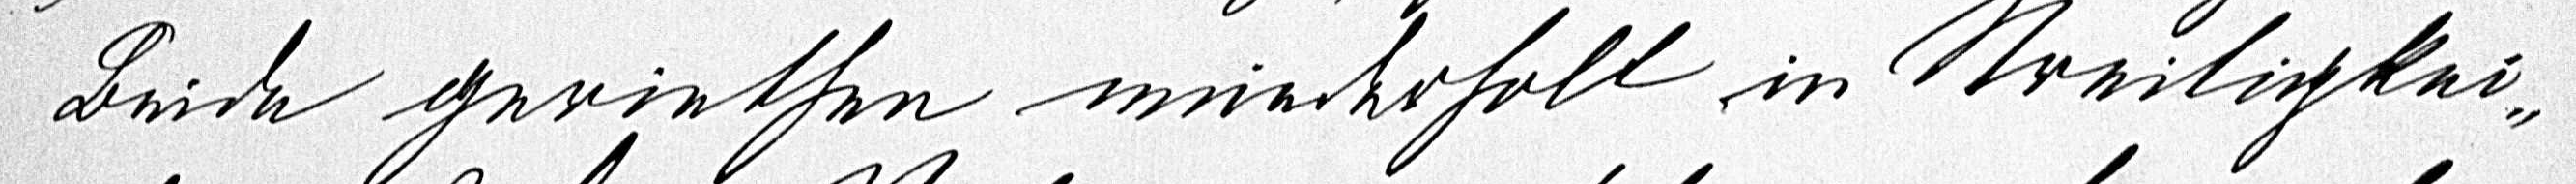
Beide geriethen wiederholt in Streitigkei¬
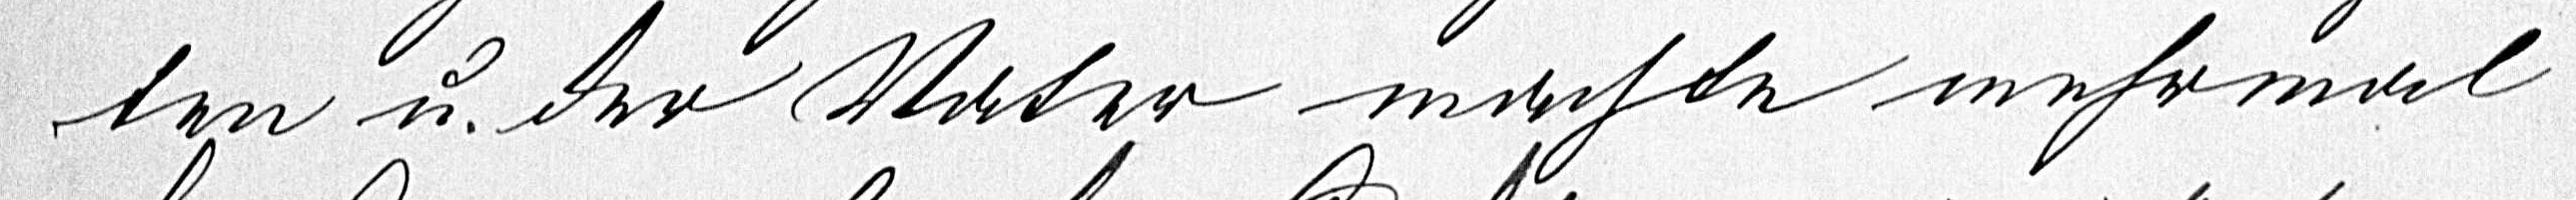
ten u. der Vater machte mehrmal
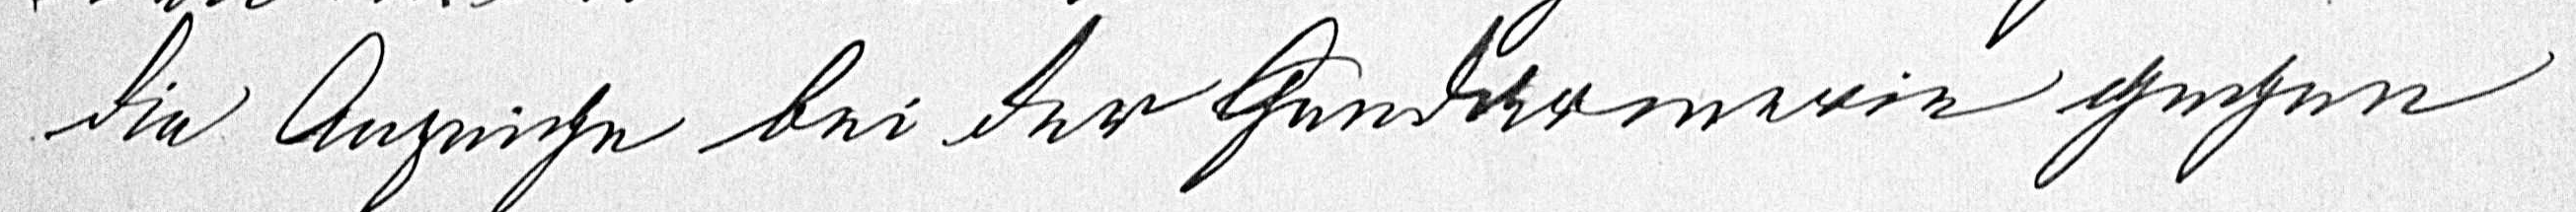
die Anzeige bei der Gendarmerie gegen
